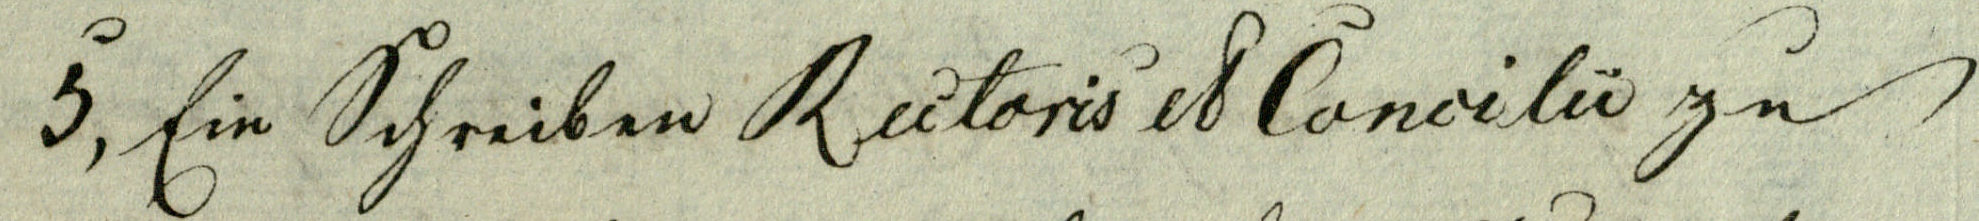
5, Ein Schreiben Rectoris et Concilii zu
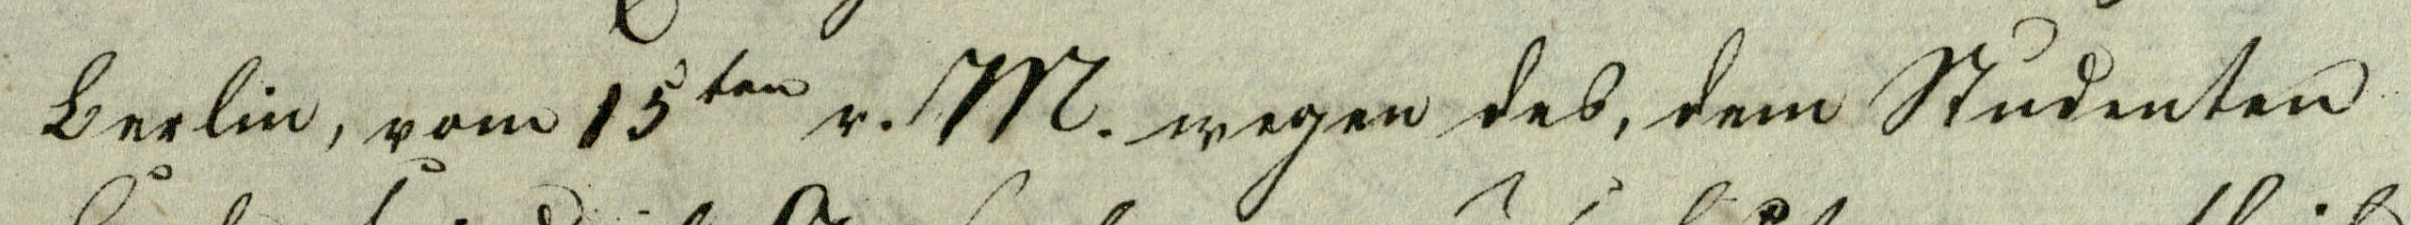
Berlin, vom 15ten v. M. wegen des, dem Studenten
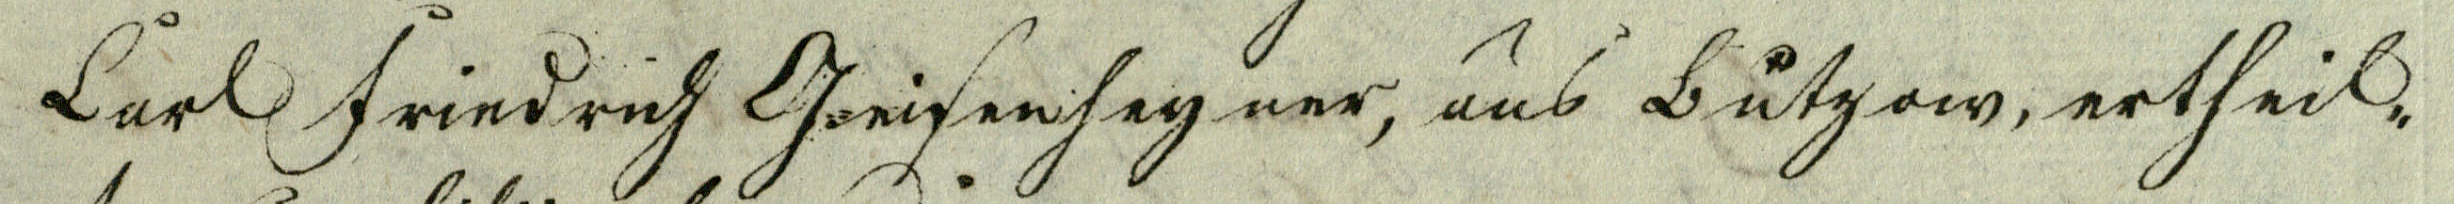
Carl Friedrich Greisenheyner, aus Bützow, ertheil¬
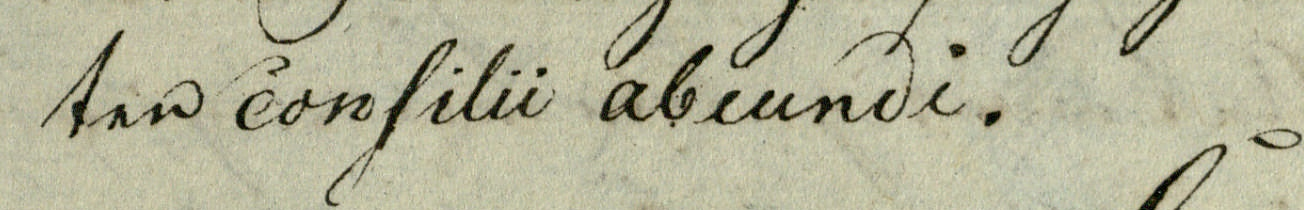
ten consilii abeundi.
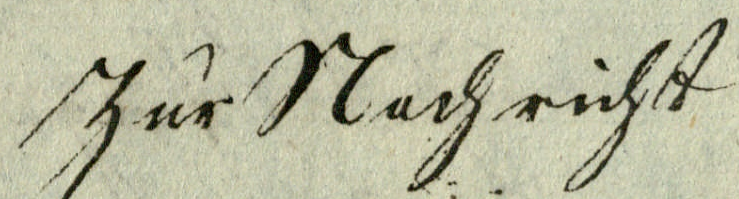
Zur Nachricht
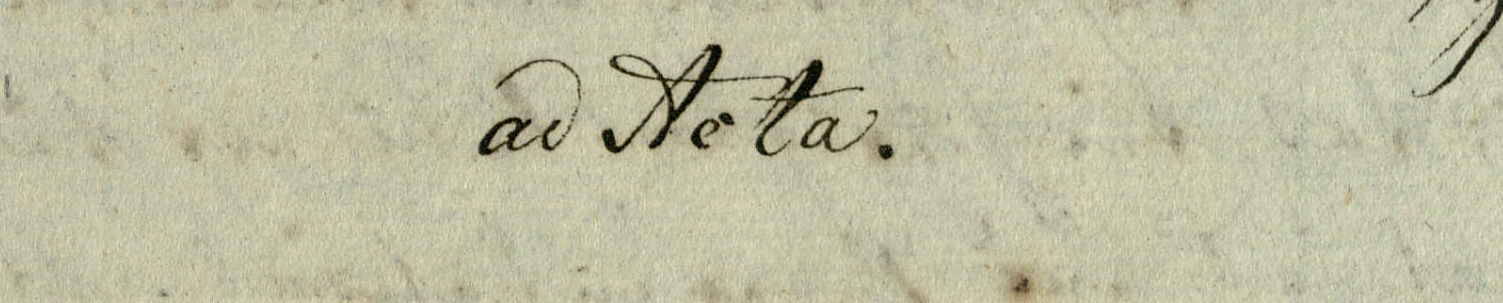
ad Acta.
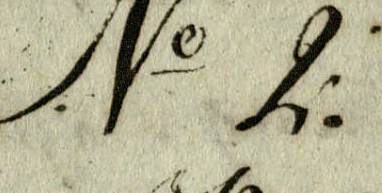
Nº 2.
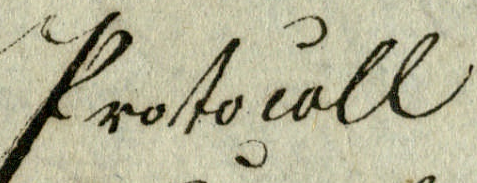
Protocoll
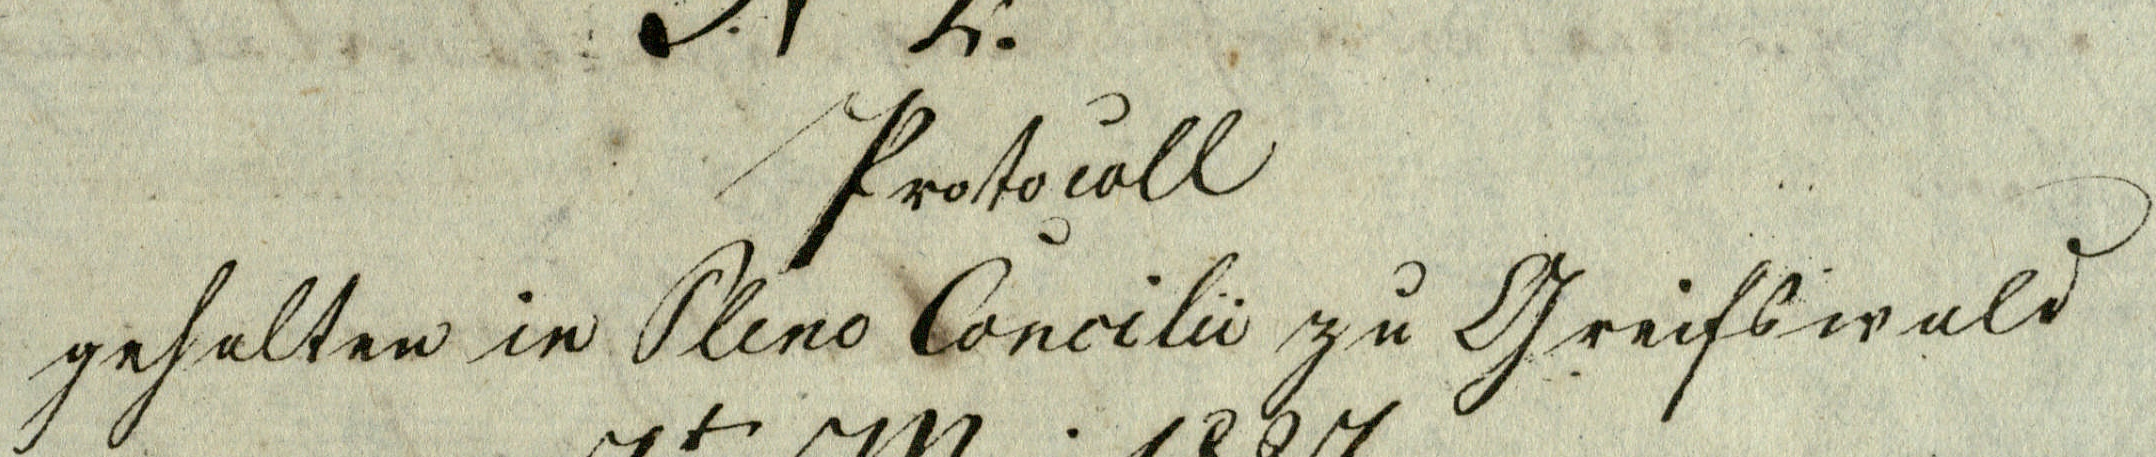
gehalten in Pleno Concilii zu Greifswald
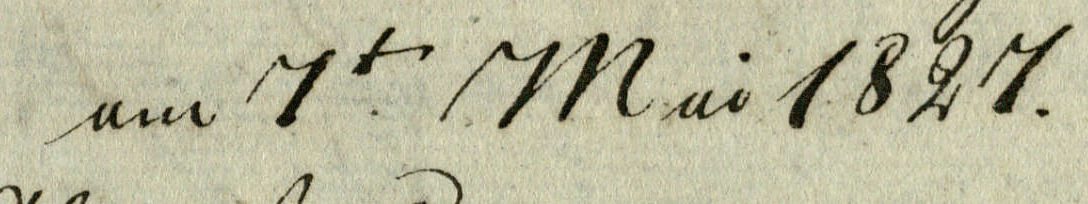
am 7ten Mai 1827.
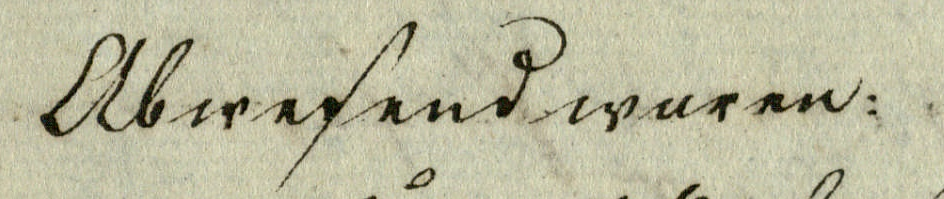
Abwesend waren:
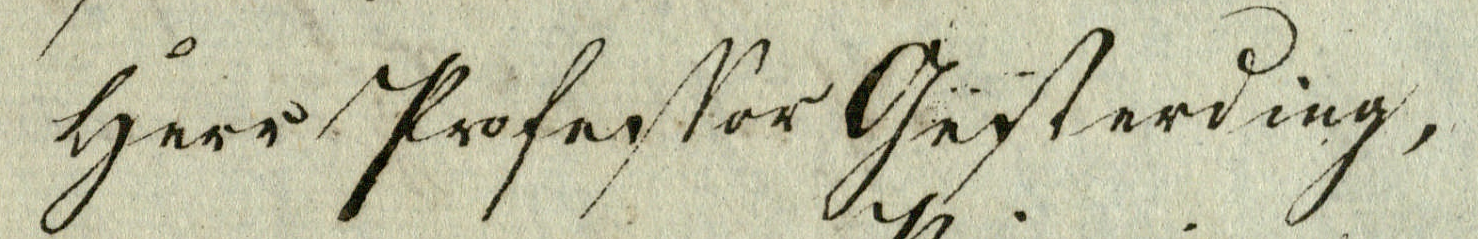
HerrProfessor Gesterding,
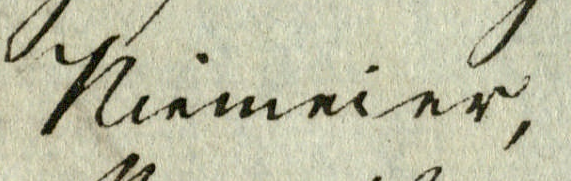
Niemeier,
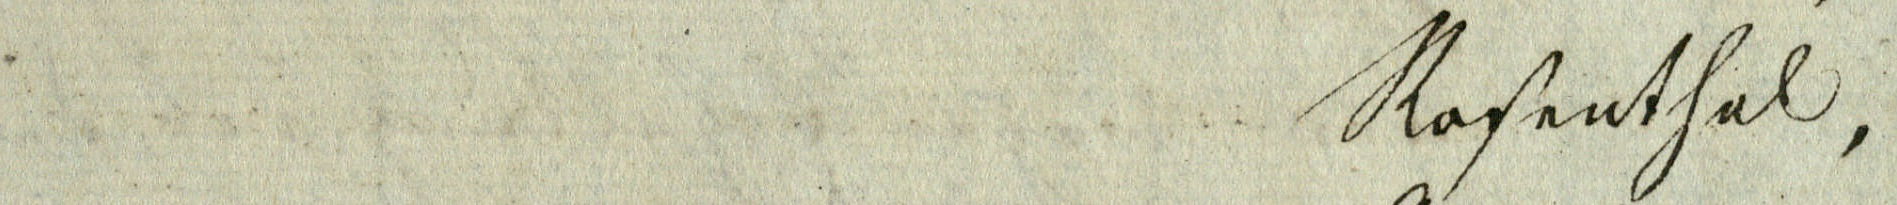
Rosenthal,
